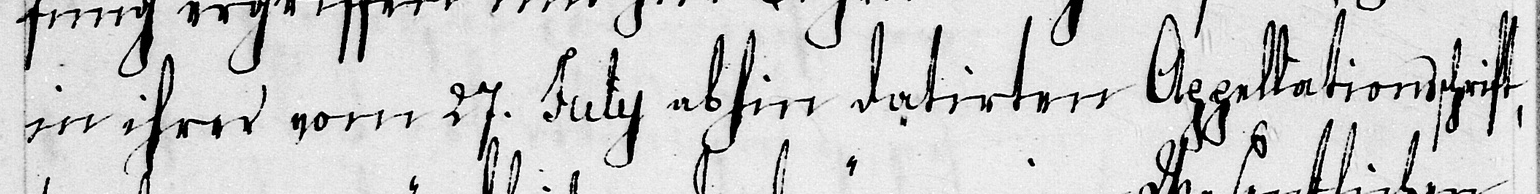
in ihrer vom 27. July abhin datirten Appellationsschr¬
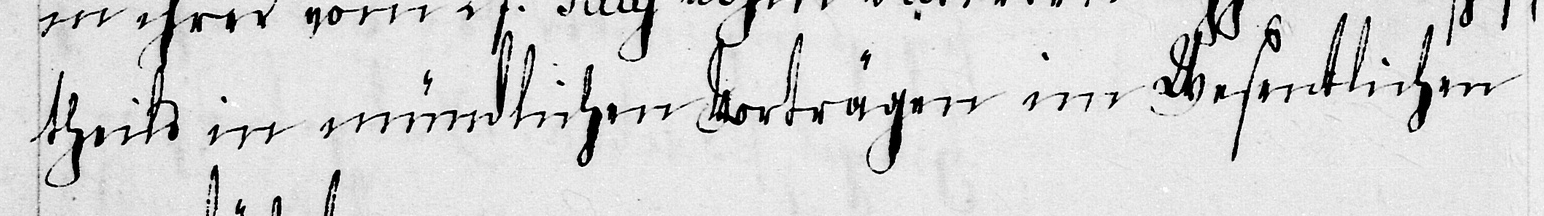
theils in mündlichen Vorträgen im Wesentlichen
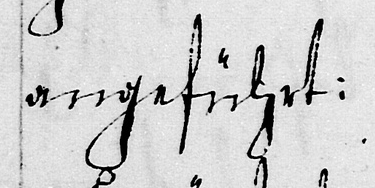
angeführt:
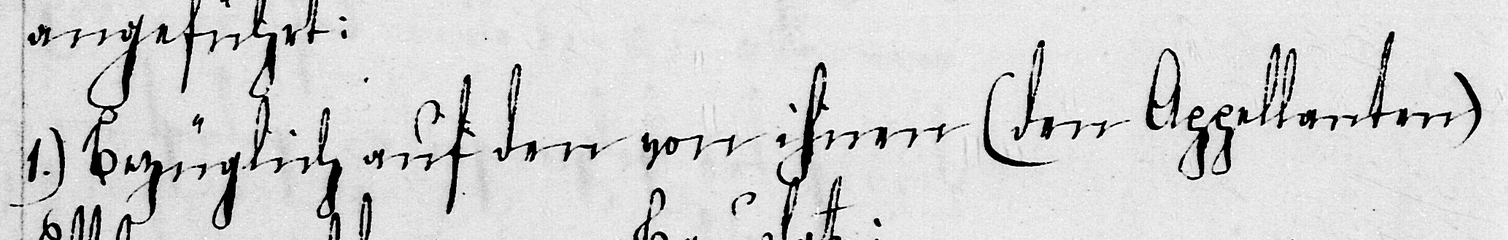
1.) Bezüglich auf den von ihnen (den Appellanten)
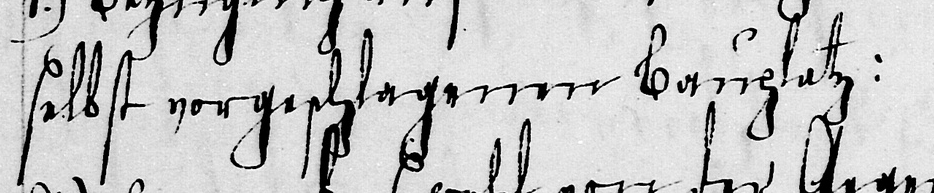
selbst vorgeschlagenen Bauplatz:
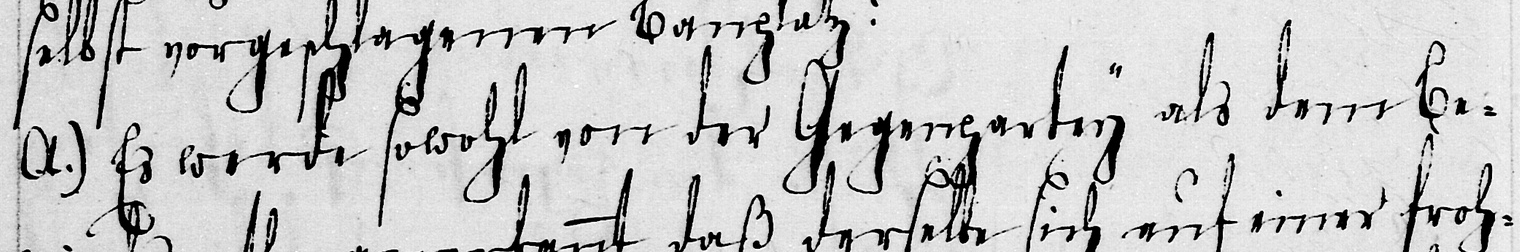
a.) Es werde sowohl von der Gegenpartey als dem Be¬
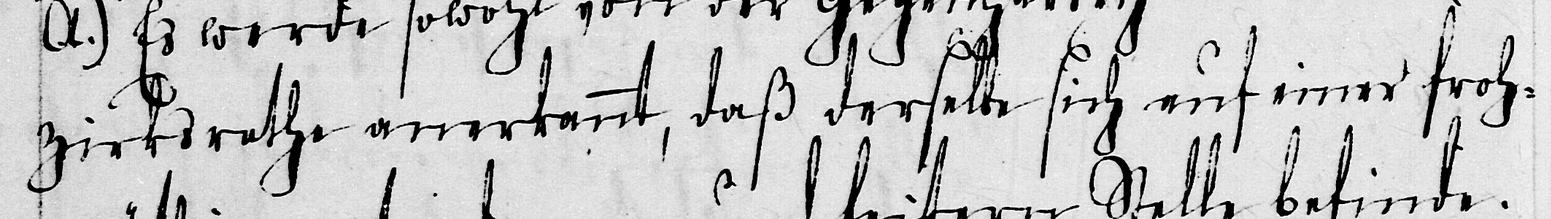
zirksrathe anerkannt, daß derselbe sich auf einer froh¬
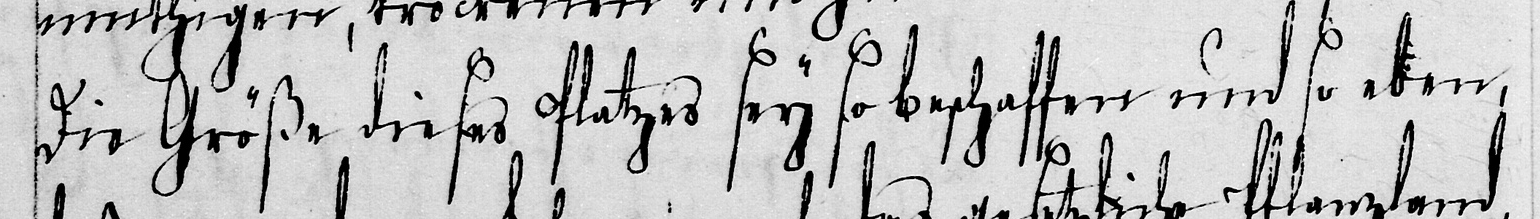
Die Größe dieses Platzes sey so beschaffen und so eben,
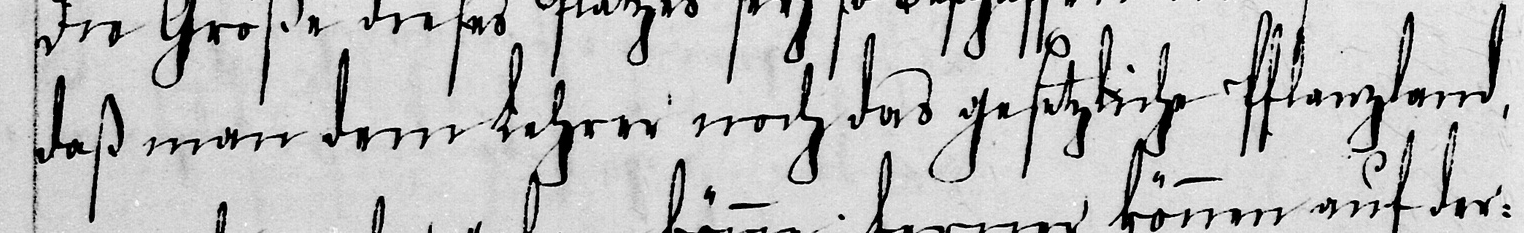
daß man dem Lehrer noch das gesetzliche Pflanzland,
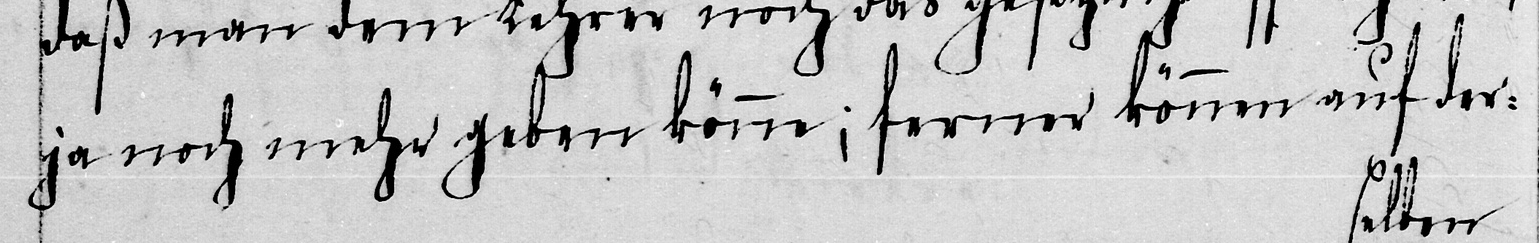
ja noch mehr geben könne; ferner können auf der-
